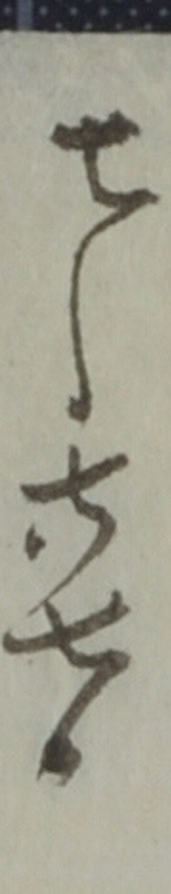七月廿七日
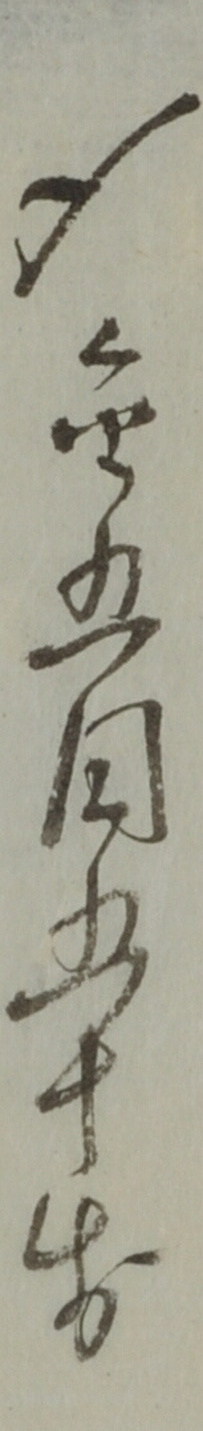〆金五円五十銭
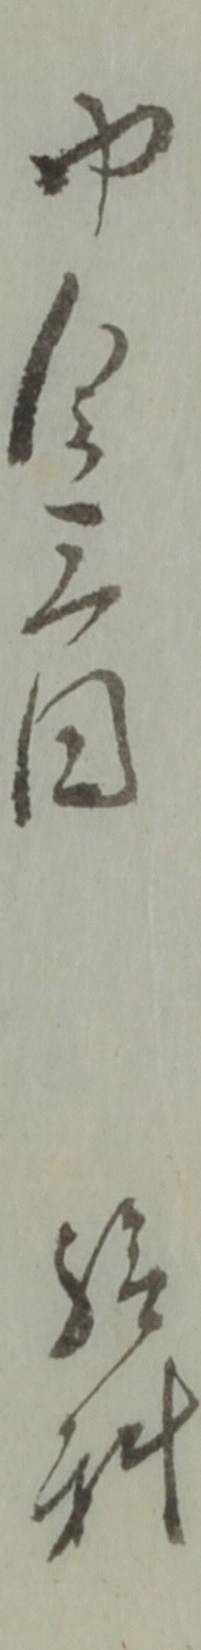巾金三円給料
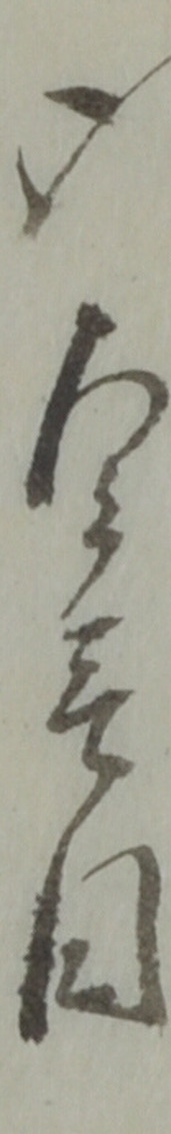〆金壱円
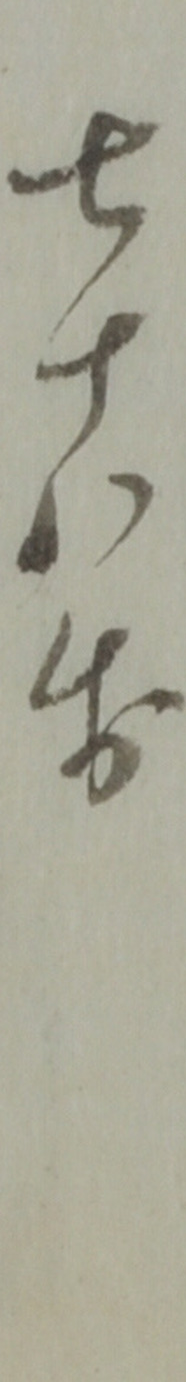七十八銭
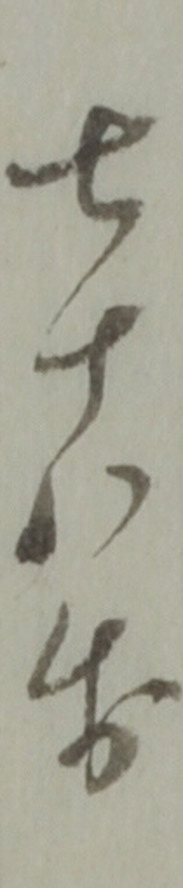七十八銭

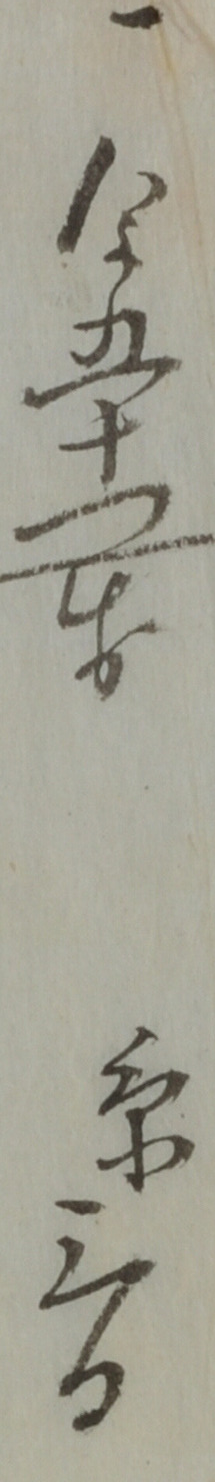一金五十一銭糸三日
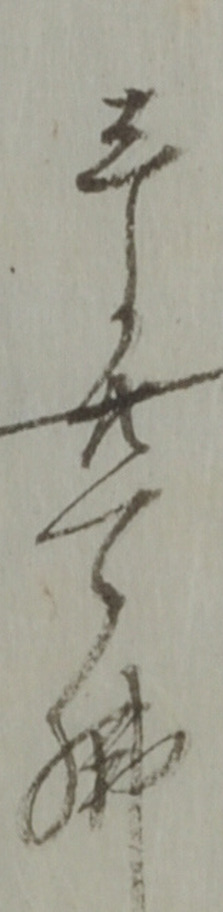三月廿一日払

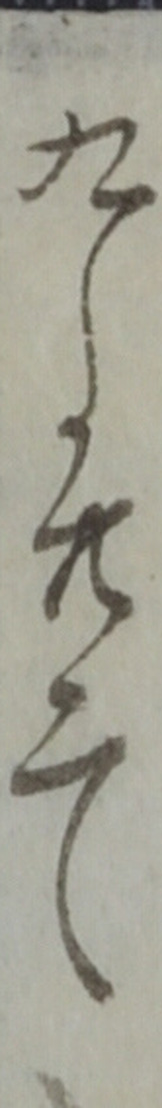九月廿二日
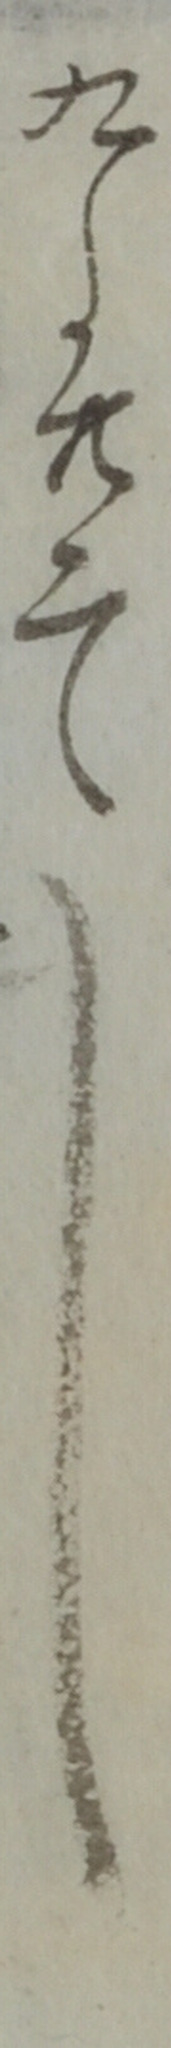九月廿二日
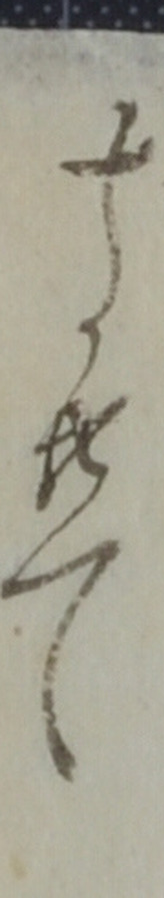十月廿一日
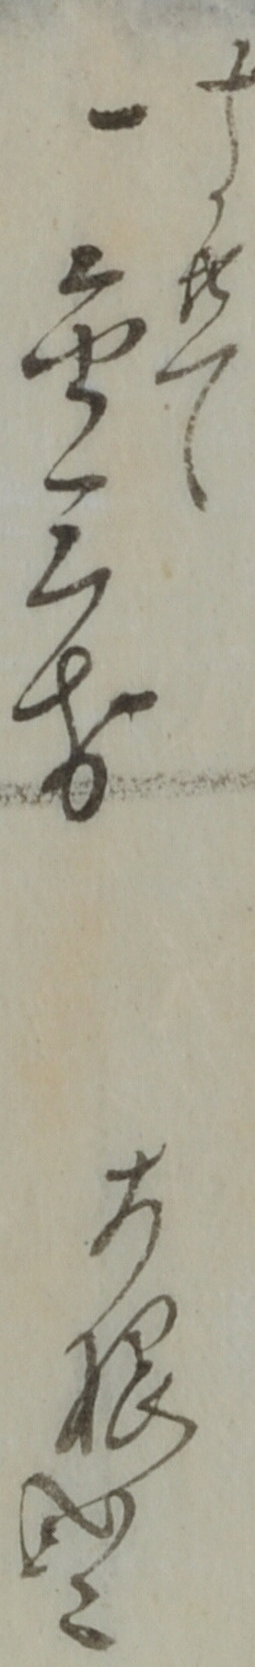一金三銭大根弐こ
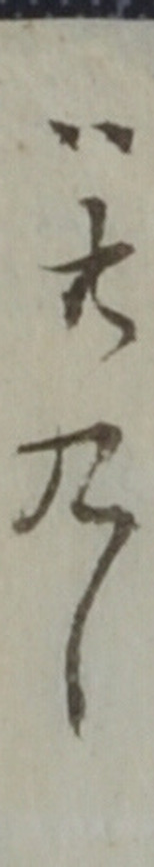〃廿九日
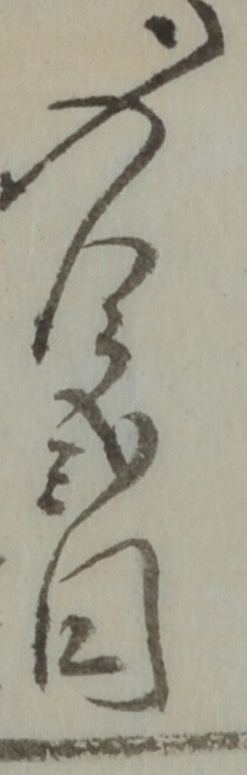〆金弐円
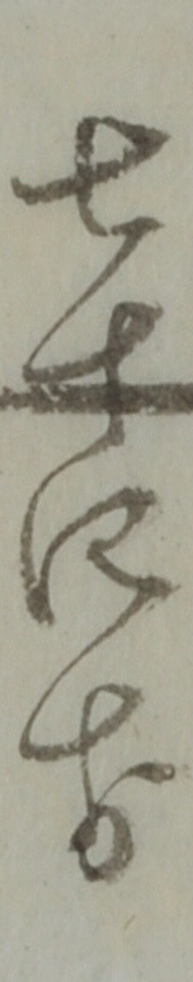七十四銭
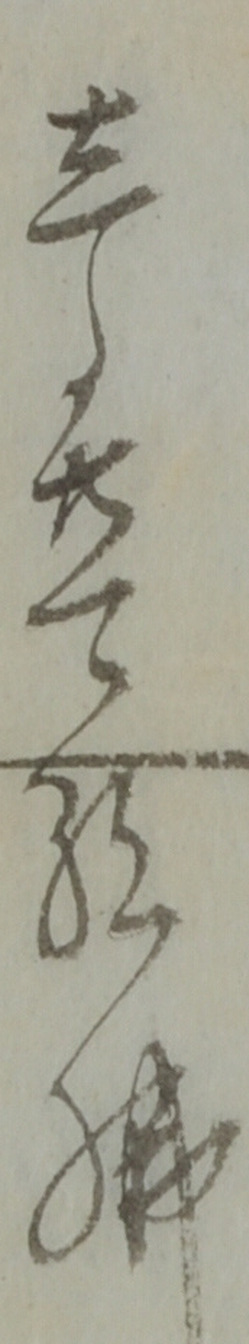十月廿一日
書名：工女名前並金員渡諸事控
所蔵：伊那市立高遠町図書館・合同会社AMANE
